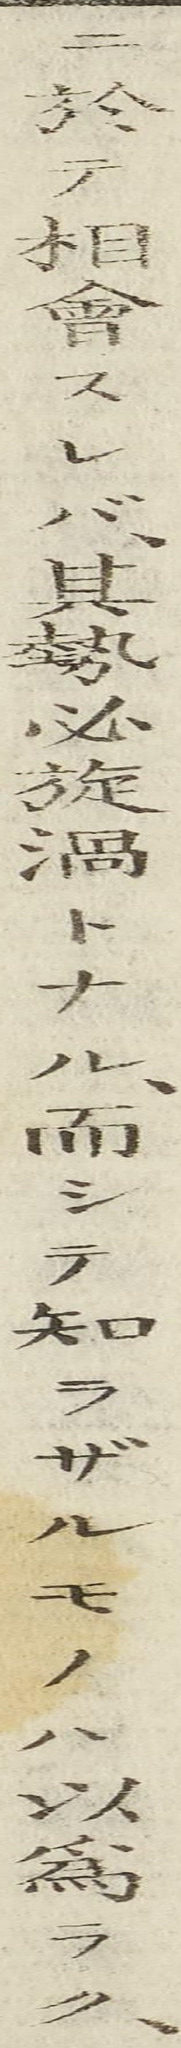ニ於テ相会スレバ、其勢必旋渦トナル、而シテ知ラザルモノハ以為ラク、

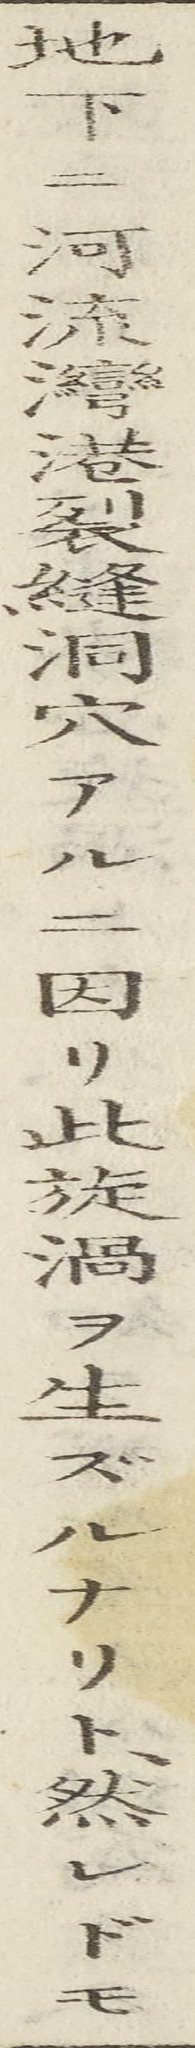地下ニ河流湾港裂縫洞穴アルニ因リ此旋渦ヲ生ズルナリト、然レドモ
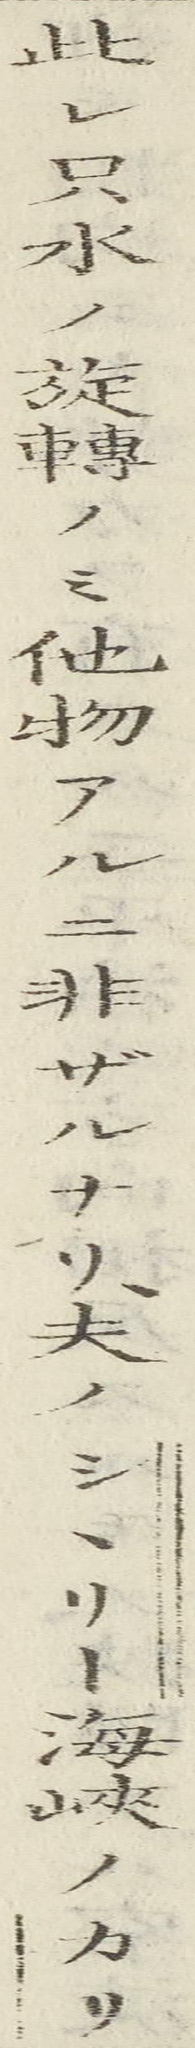此レ只水ノ旋転ノミ他物アルニ非ザルナリ、夫ノシヽリー海峡ノカリ
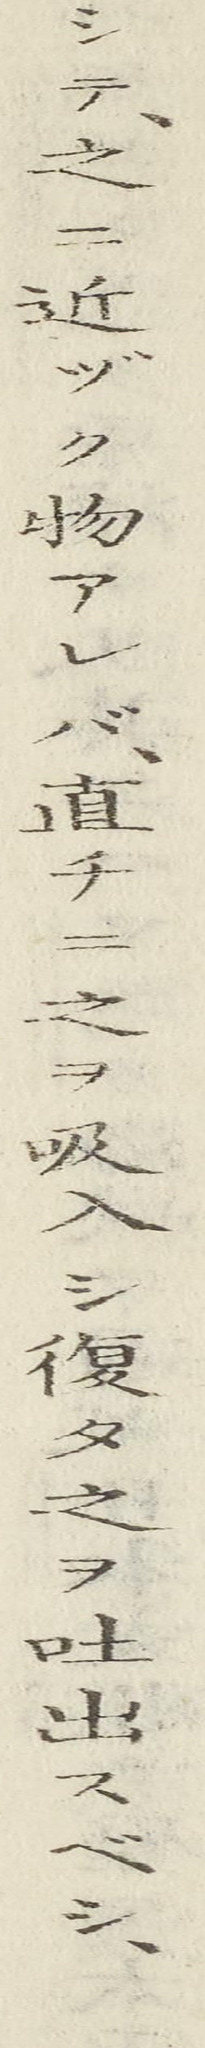シテ、之ニ近ヅク物アレバ、直チニ之ヲ吸入シ復タ之ヲ吐出スベシ、
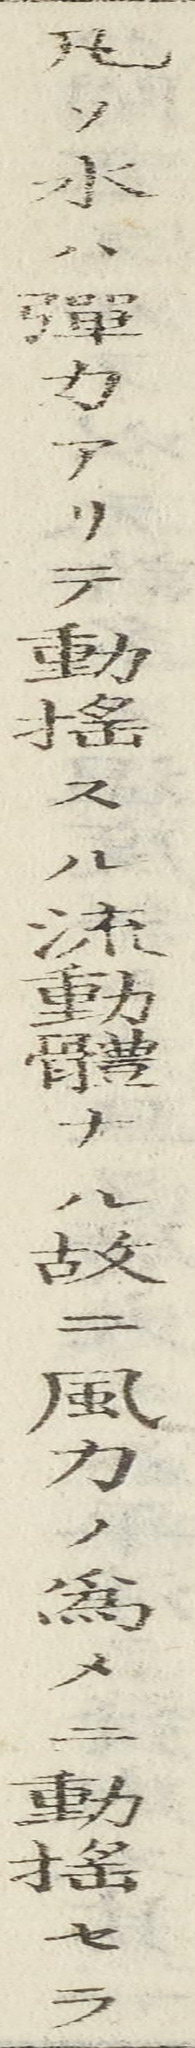凡ソ水ハ弾力アリテ動揺スル流動体ナル故ニ風力ノ為メニ動揺セラ
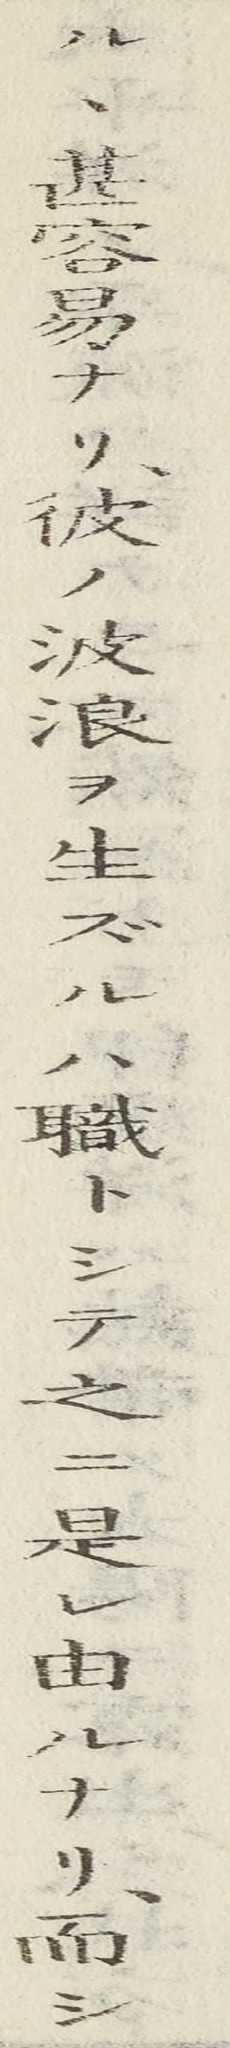ルヽ甚容易ナリ、彼ノ波浪ヲ生ズルハ職トシテ之ニ是レ由ルナリ、而シ
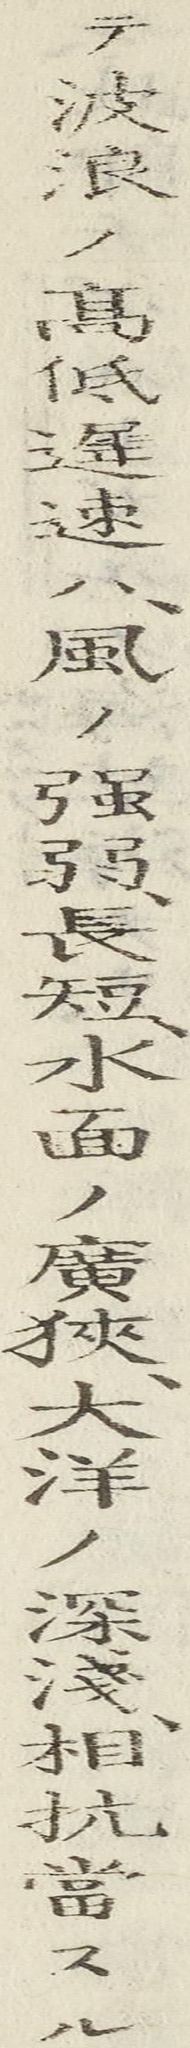テ波浪ノ高低遅速ハ、風ノ強弱、長短、水面ノ広狭、大洋ノ深浅、相抗当スル
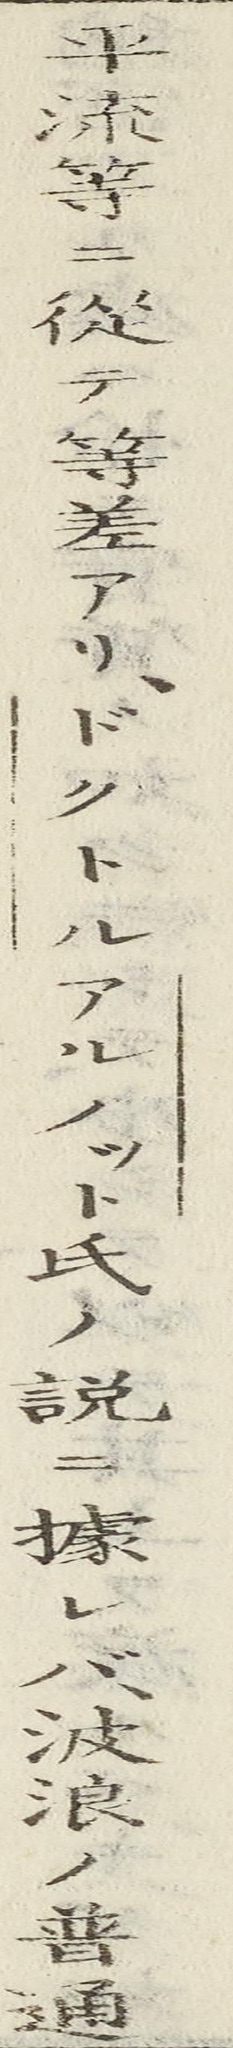平流等ニ従テ等差アリ、ドクトルアルノット氏ノ説ニ拠レバ、波浪ノ普通
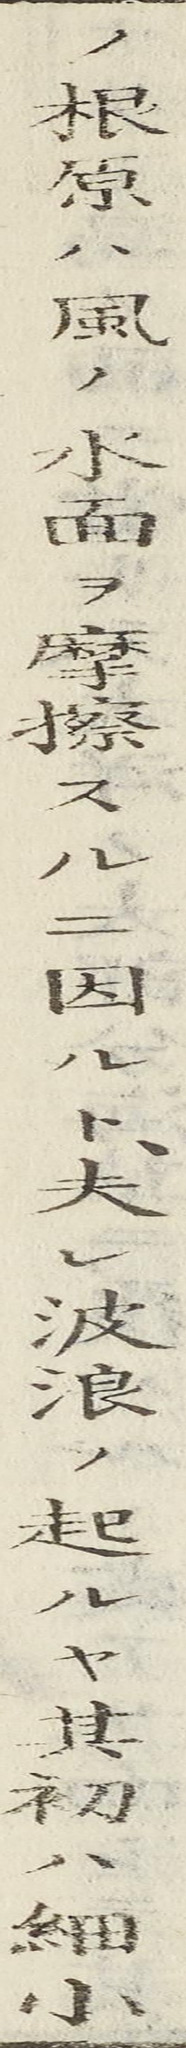ノ根原ハ風ノ水面ヲ摩擦スルニ因ルト、夫レ波浪ノ起ルヤ其初ハ細小
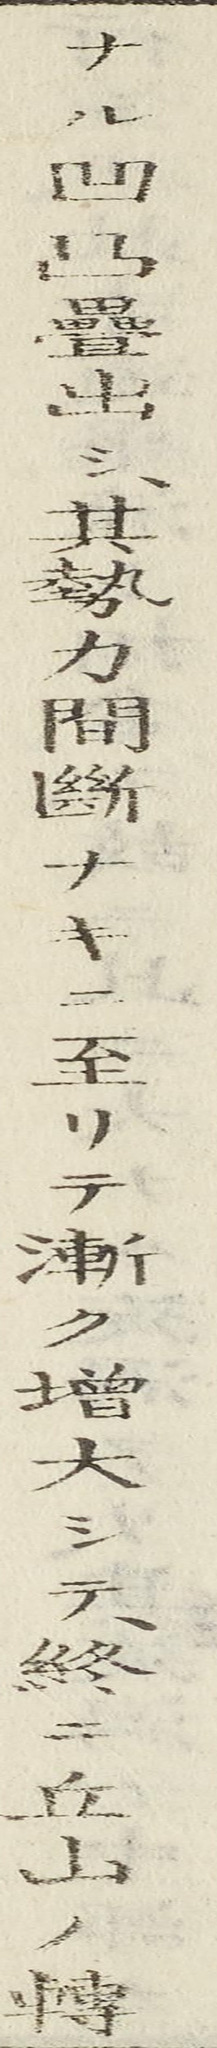ナル凹凸畳出シ、其勢力間断ナキニ至リテ漸ク増大シテ、終ニ丘山ノ転
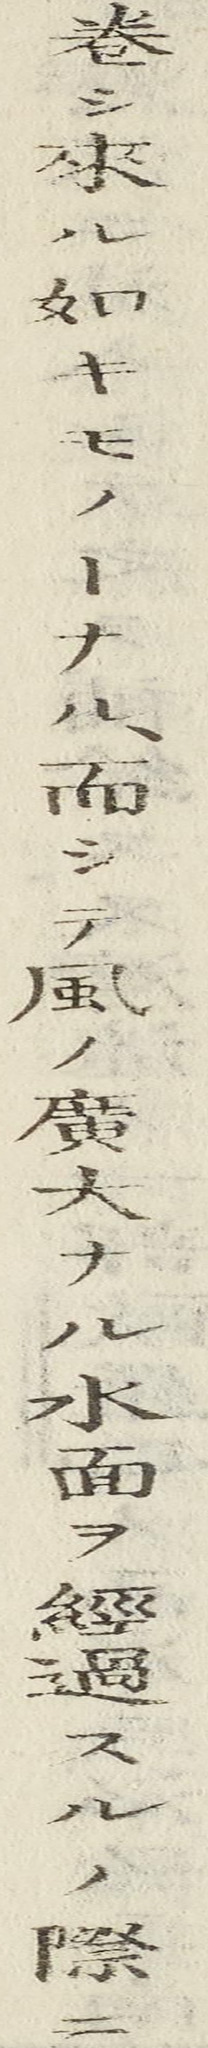巻シ来ル如キモノトナル、而シテ風ノ広大ナル水面ヲ経過スルノ際ニ
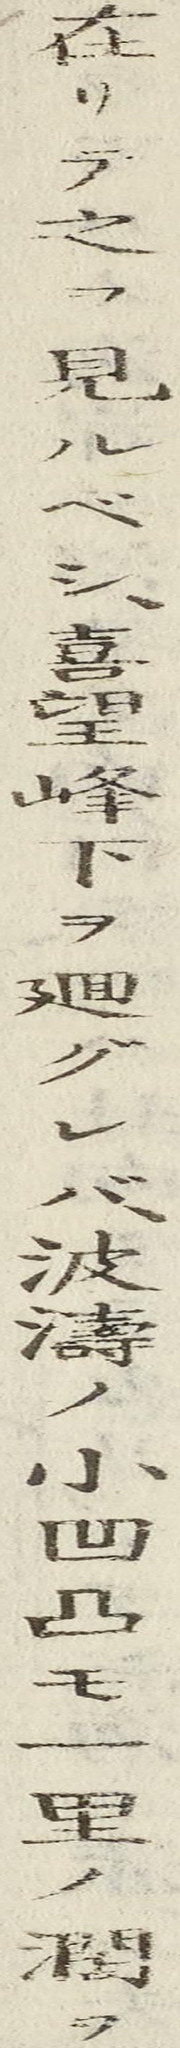在リテ之ヲ見ルベシ、喜望峰下ヲ廻グレバ、波濤ノ小凹凸モ一里ノ濶ヲ
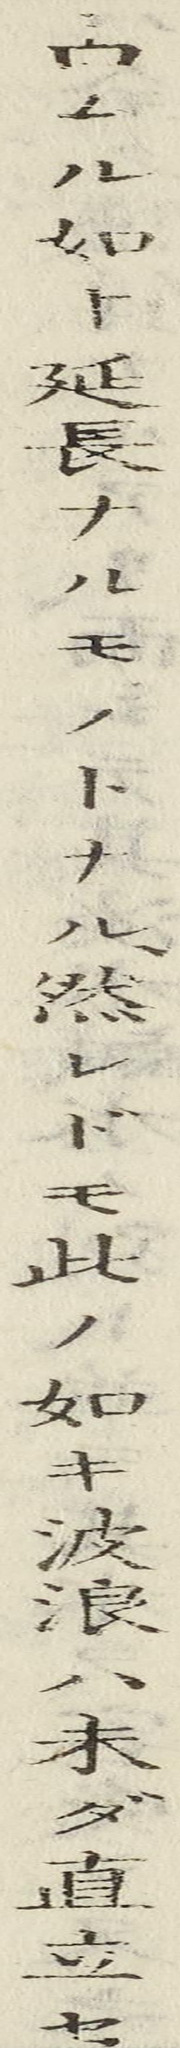ウムル如キ延長ナルモノトナル、然レドモ此ノ如キ波浪ハ未ダ直立セ
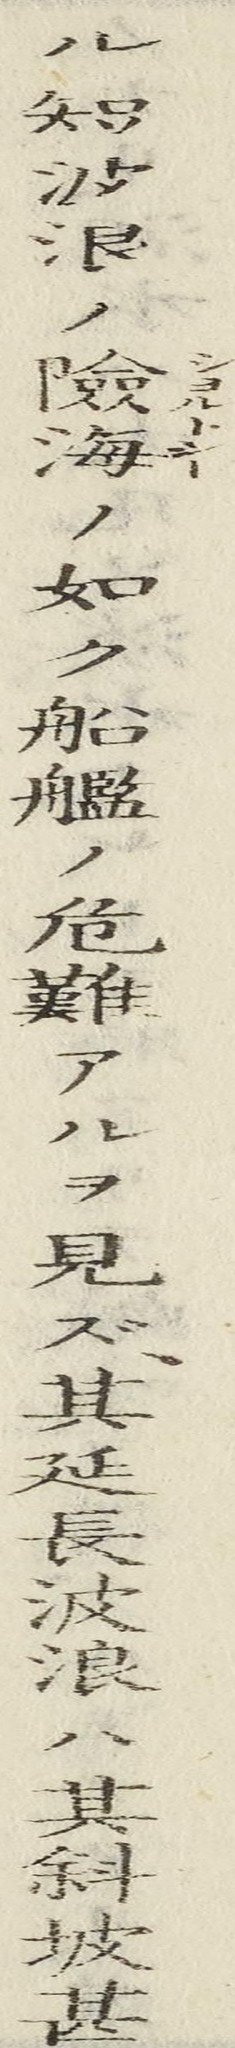ル短波浪ノ険海ノ如ク船艦ノ危難アルヲ見ズ、其延長波浪ハ其斜坡甚
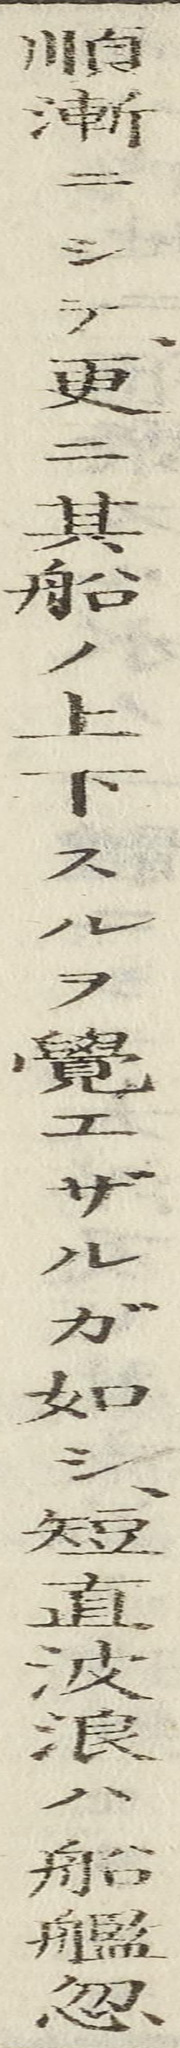順漸ニシテ、更ニ其船ノ上下スルヲ覚エザルガ如シ、短直波浪ハ船艦忽
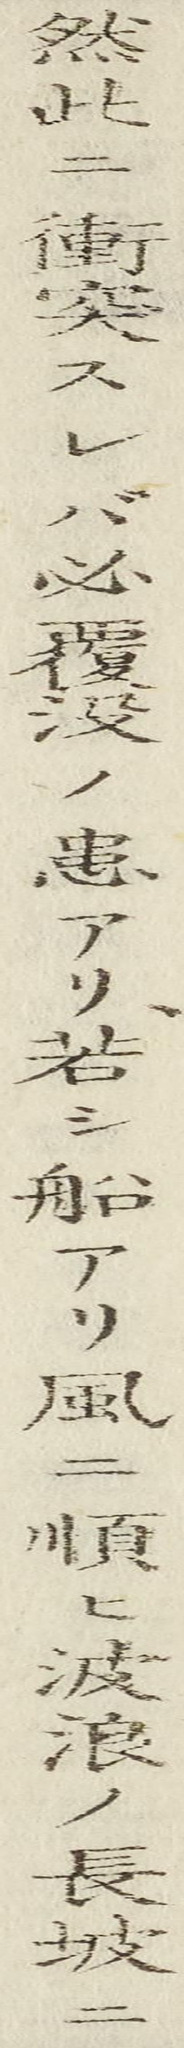然此ニ衝突スレバ必覆没ノ患アリ、若シ船アリ風ニ順ヒ波浪ノ長坡ニ
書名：百科全書　地文學　全
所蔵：東京大学地震研究所図書室 Earthquake Research Institute Library, The University of Tokyo, JAPAN
